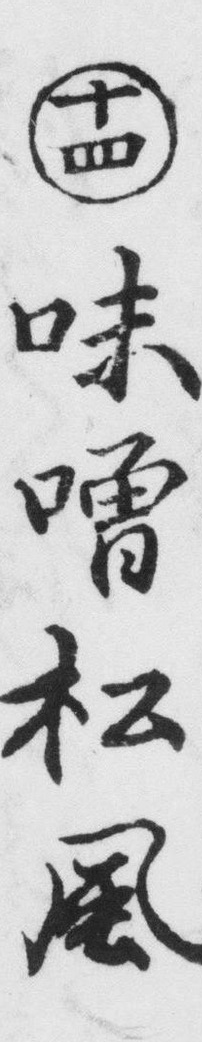(十四)味噌松風
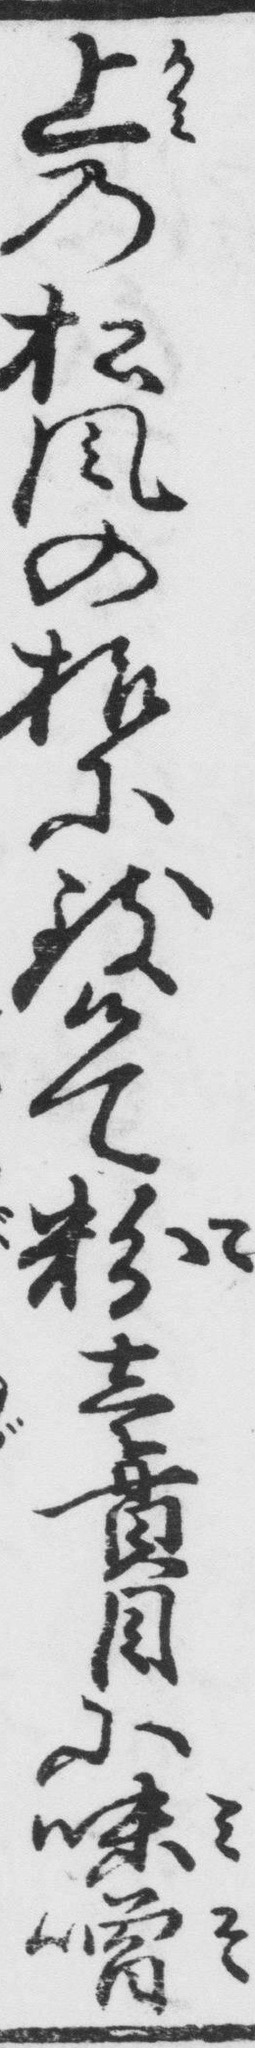上の松風の様に致候て粉壱貫目に味噌
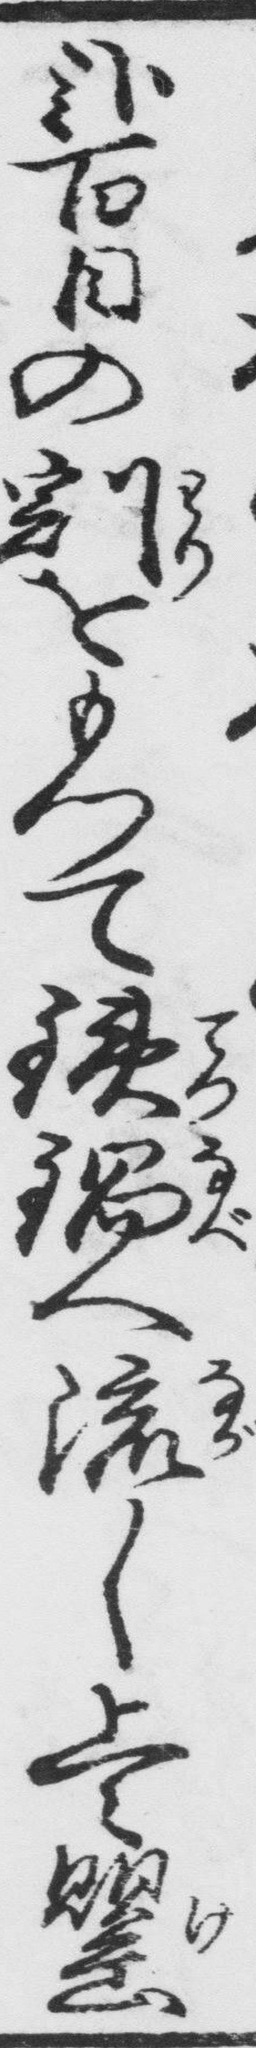弐百目の割をもつて鉄鍋へ流し上々罌
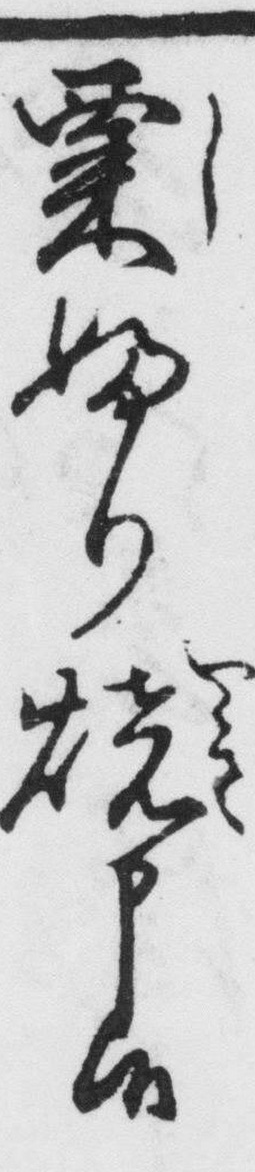粟ふり焼申候

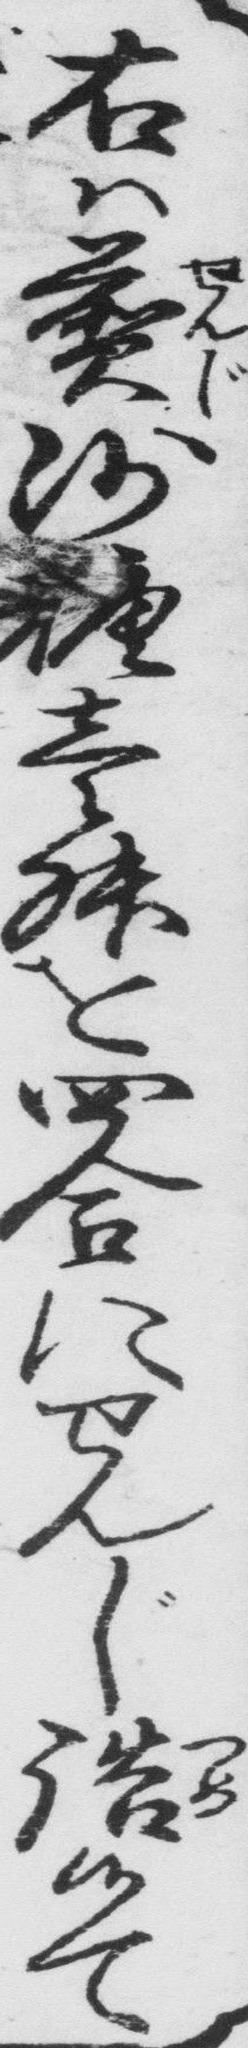右は煎沙糖壱升を四合にせんじ詰候て
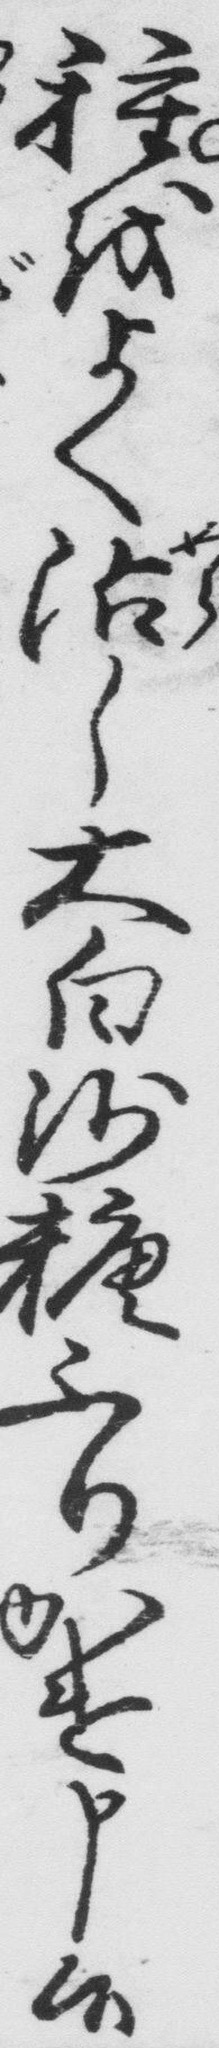種をよく沾し大白沙糖ふりかけ申候
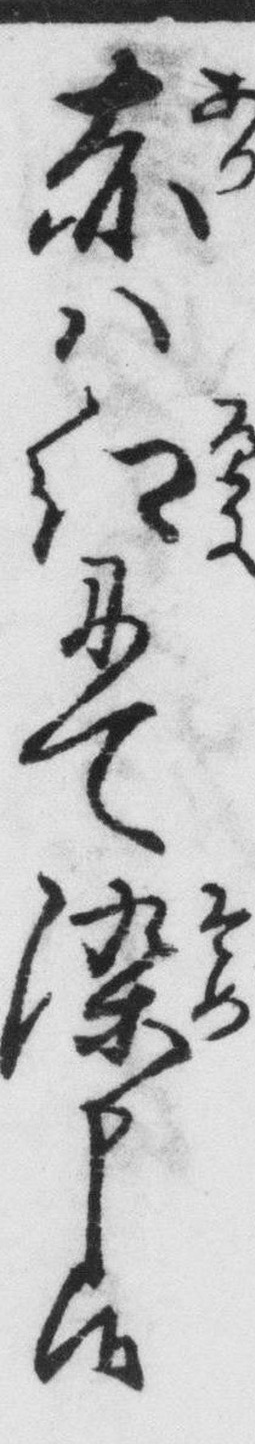赤は紅にて染申候
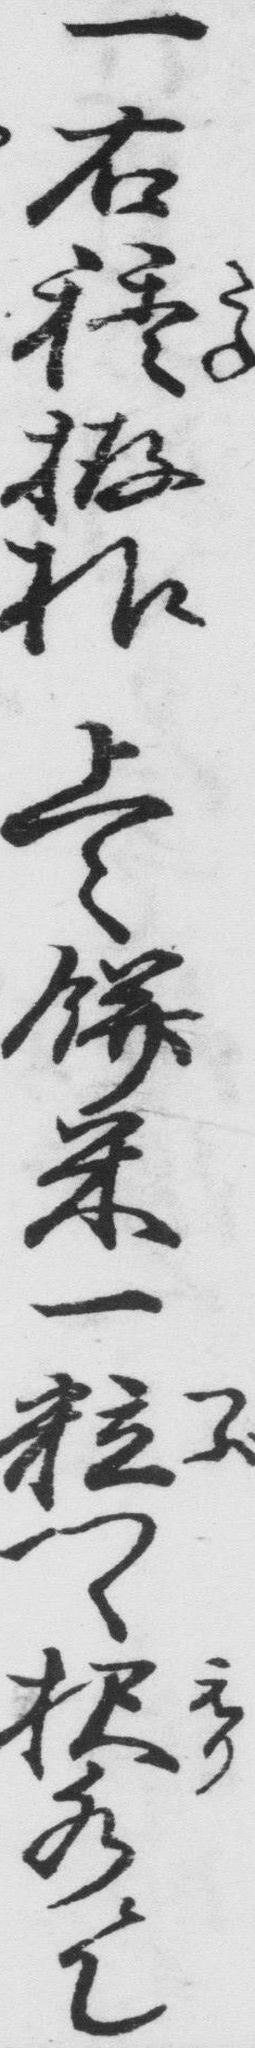一右種拵様上々餅米一粒つゝ択水にて
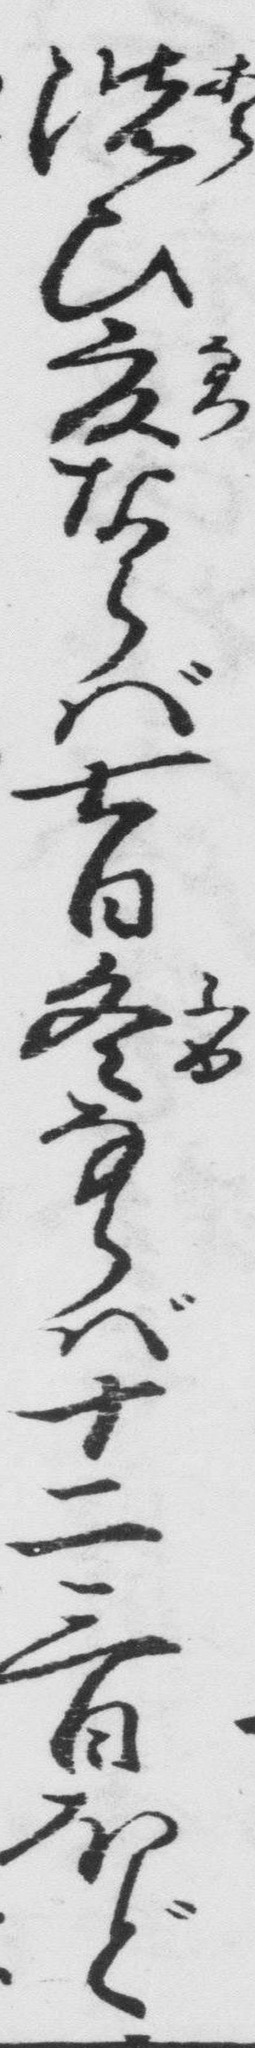洗ひ夏ならば七日冬ならば十二三日ほど
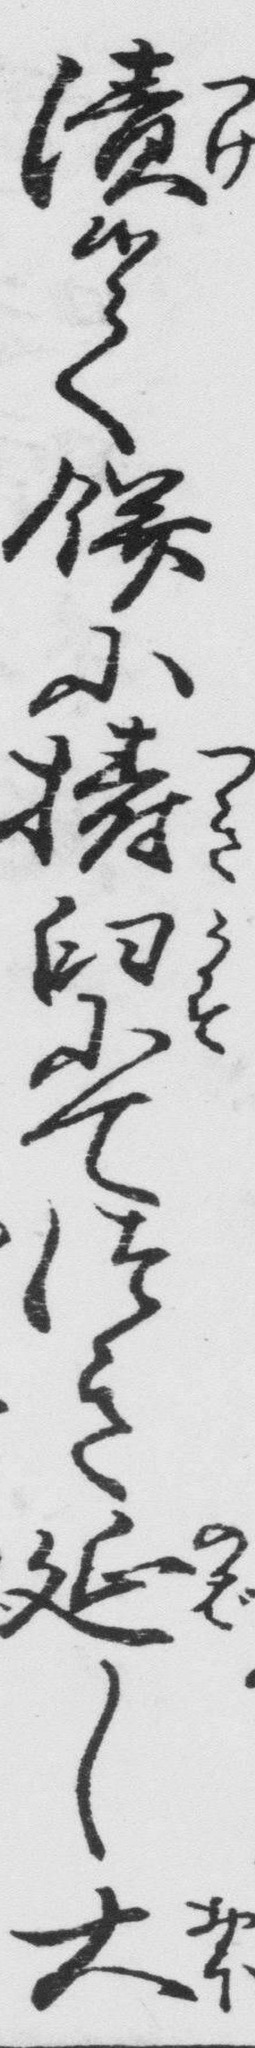漬候て餅に擣臼にてつき延し大
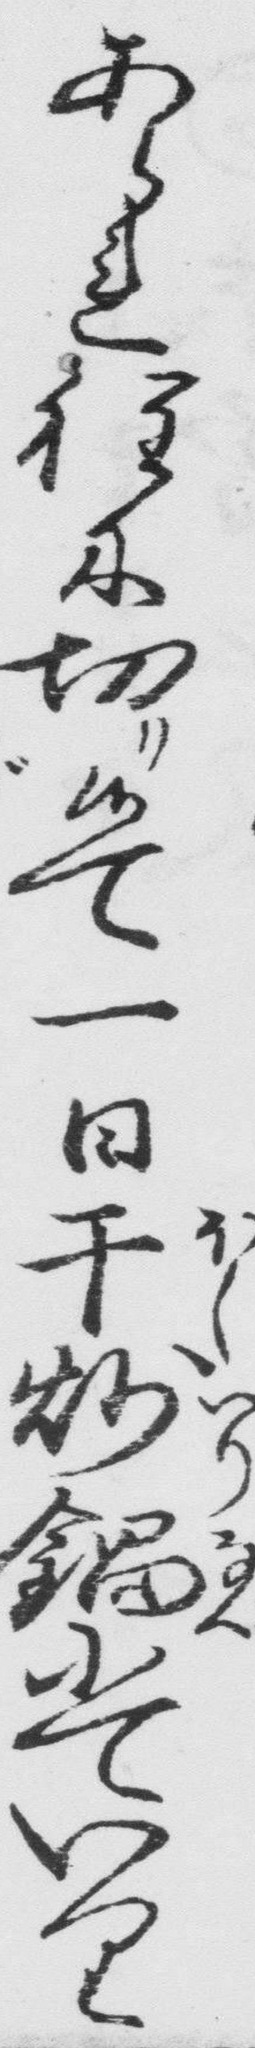あられ程に切り候て一日干炒鍋にていり
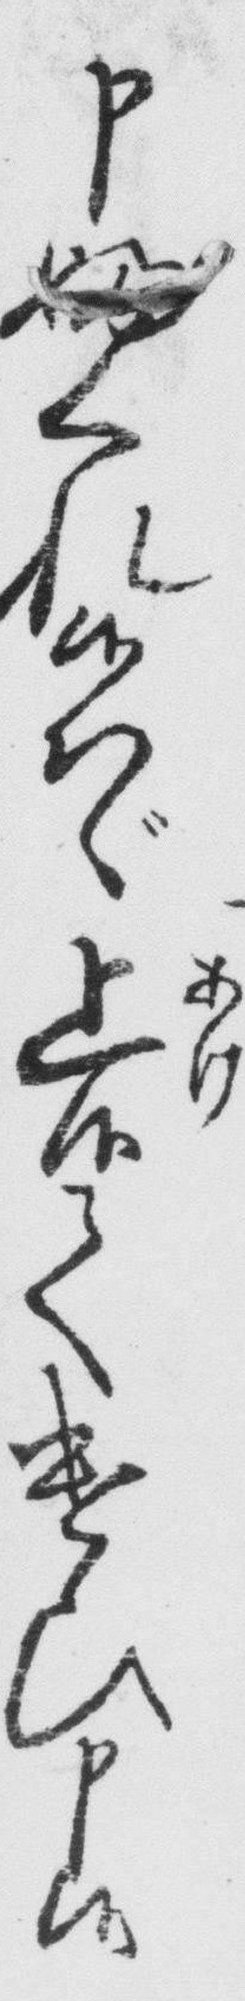申ふくれ候はゞ上候て遣ひ申候
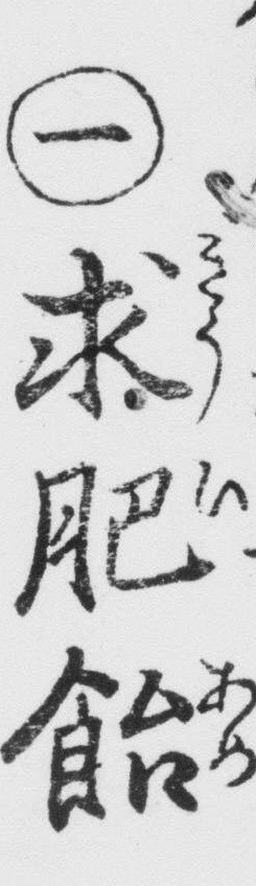(一)求肥飴
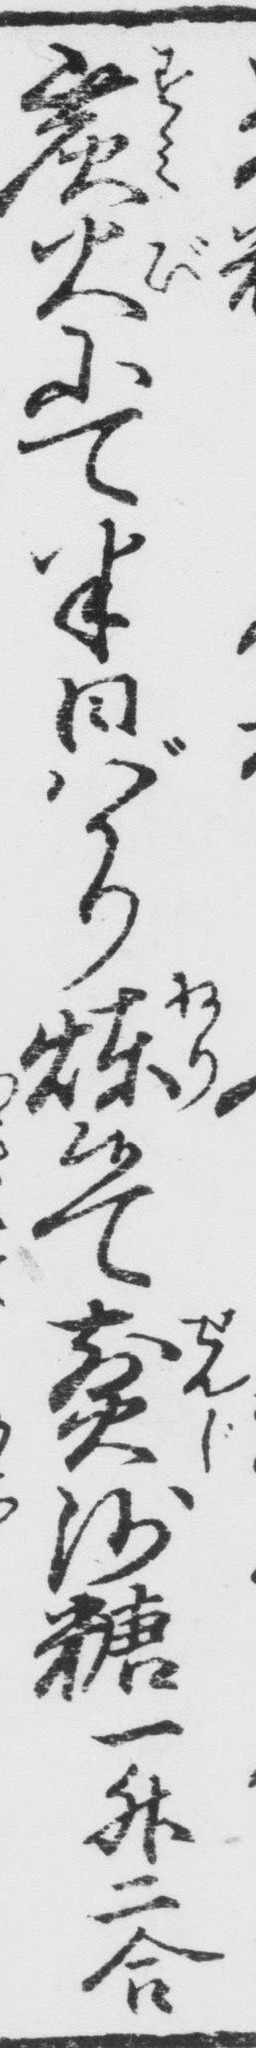炭火にて半日ばかり煉候て煎沙糖一升二合
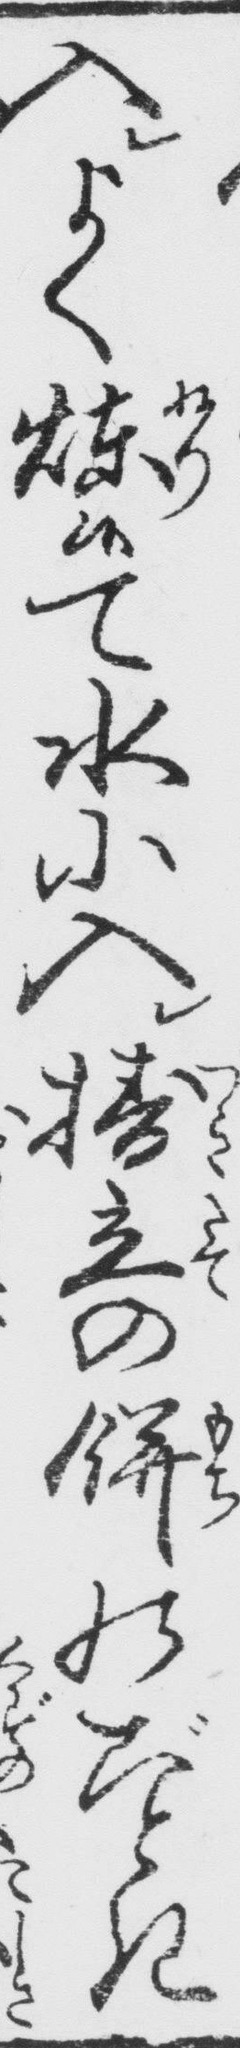入れよく煉候て水に入れ擣立の餅のごとき
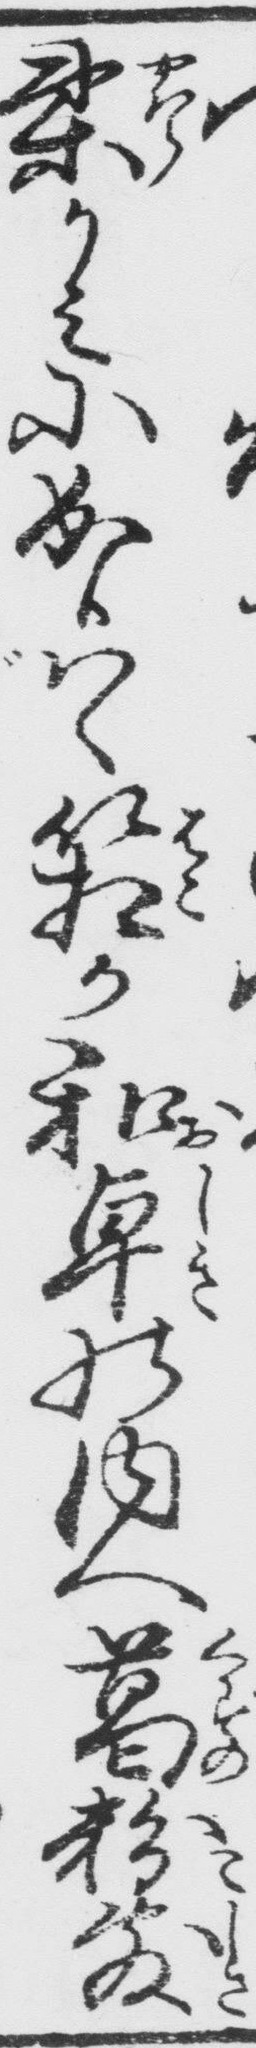柔かみに成候はゝ箱か和卓の内へ葛粉敷
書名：御前菓子図式
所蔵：大阪府立大学学術情報センター 国文学研究資料館
